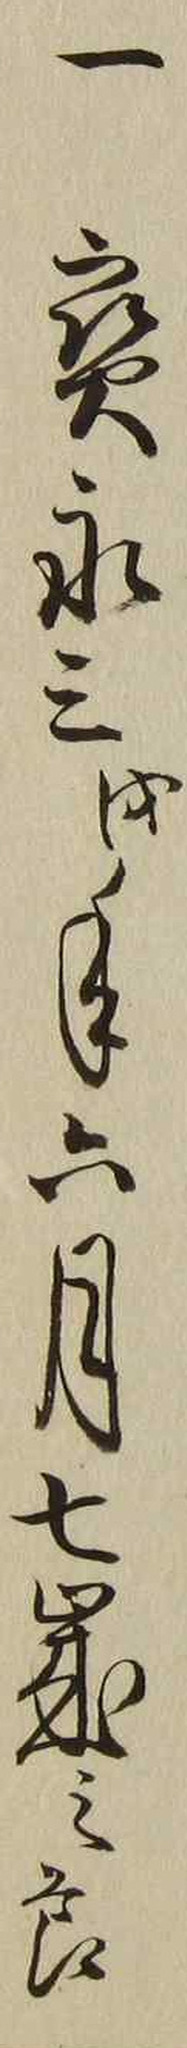一宝永三戌年六月七歳之節
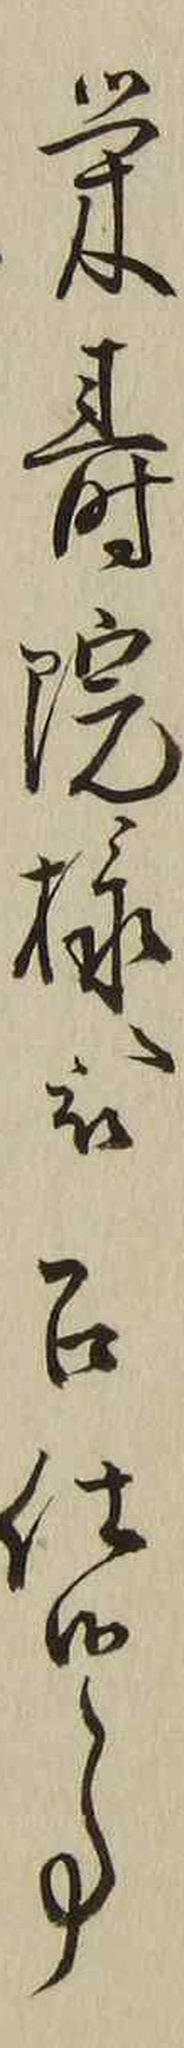栄寿院様へ被召仕候事
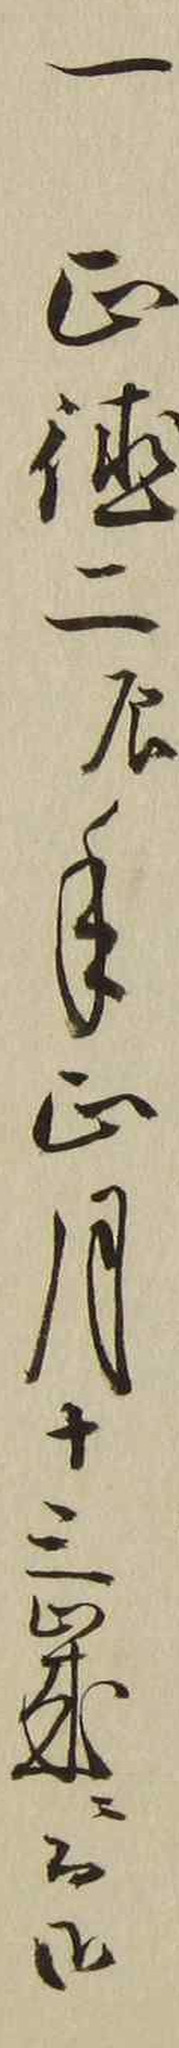一正徳二辰年正月十三歳ニ而御

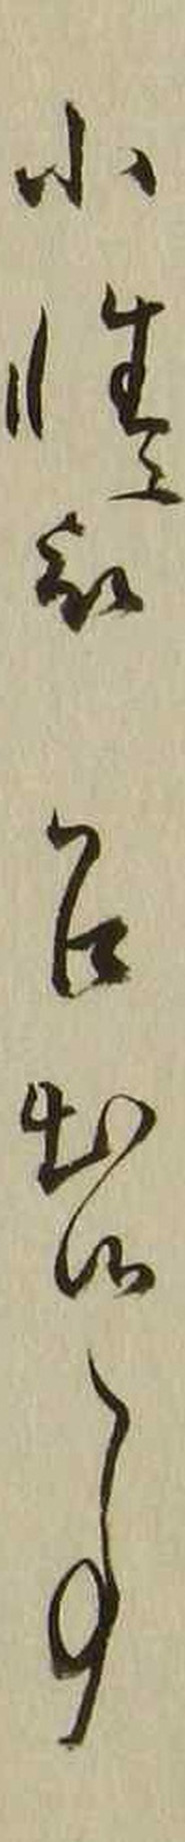小性ニ被召出候事
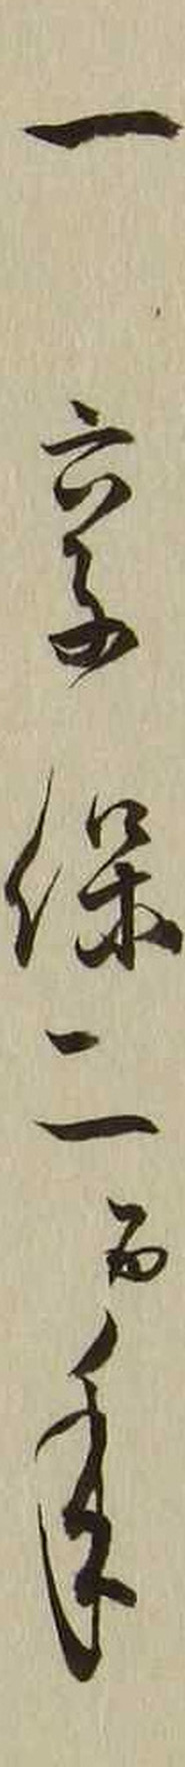一享保二酉年
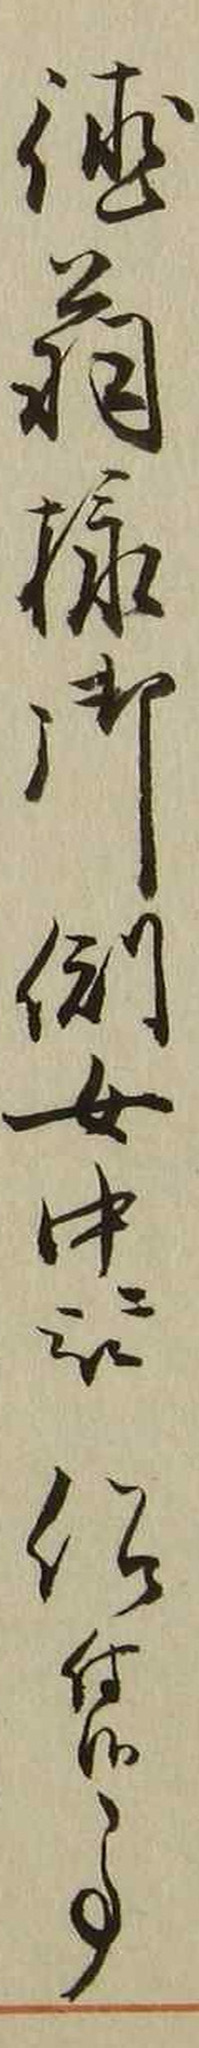徳翁様御側女中ニ被仰付候事
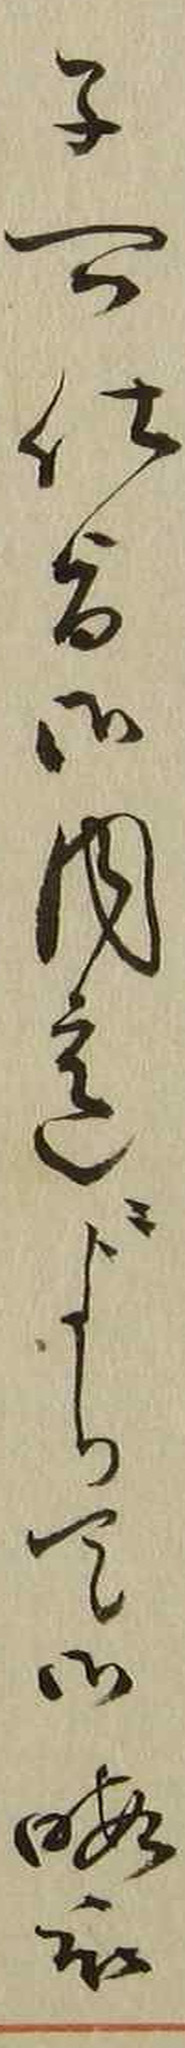子可仕旨御内定ニよりて御暇被
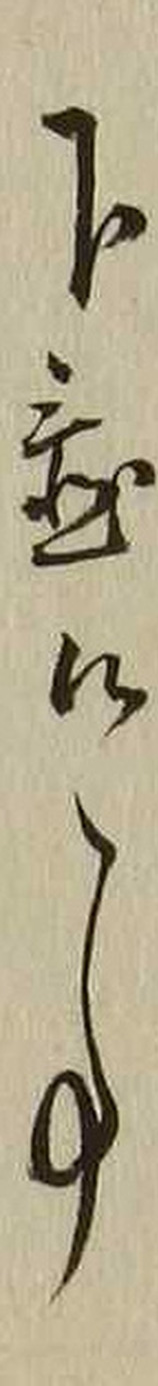下置候事
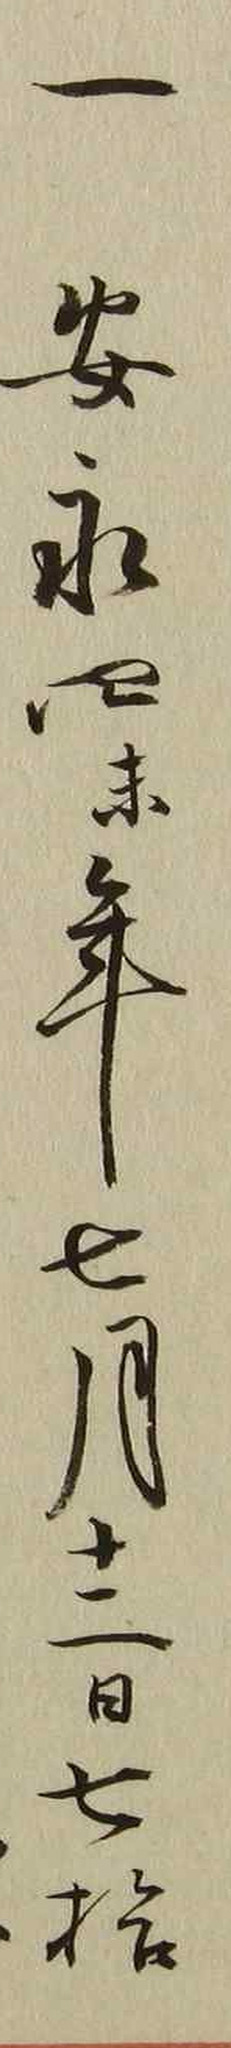一安永四未年七月十二日七拾
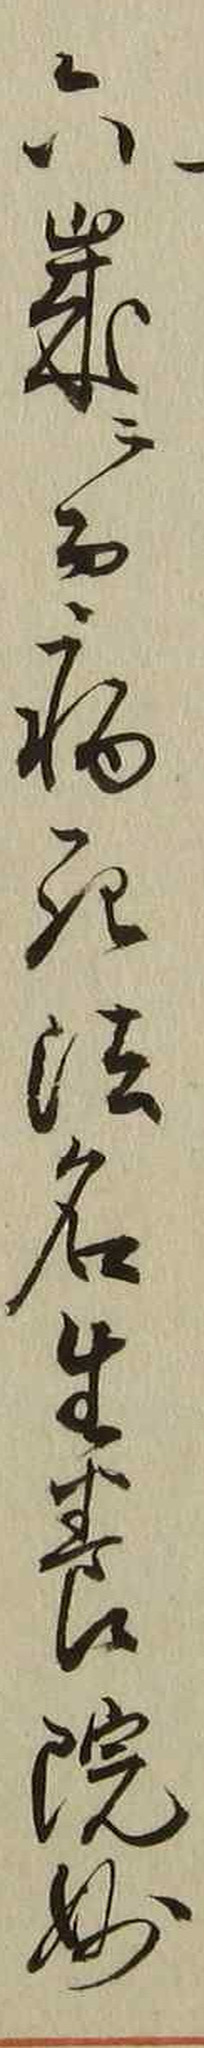六歳ニ而病死法名生養院妙
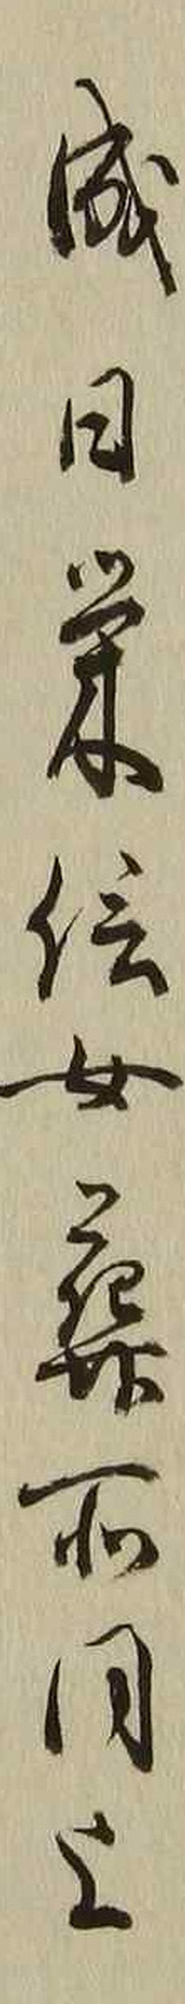成日栄信女葬所同上
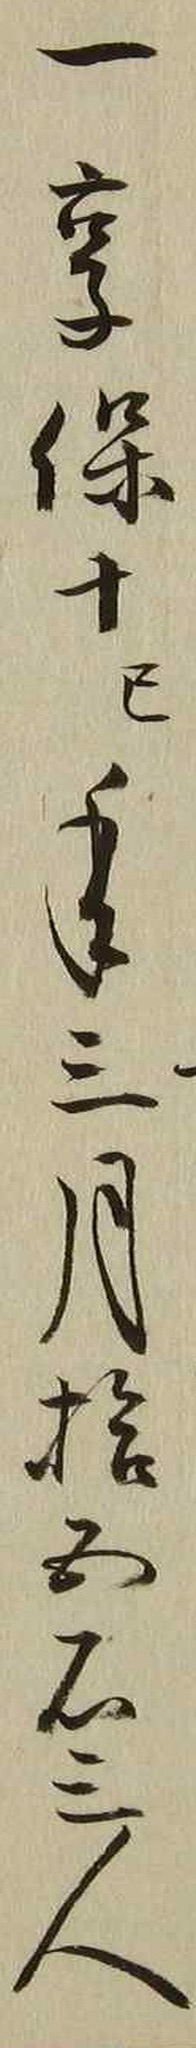一享保十巳年三月拾五石三人
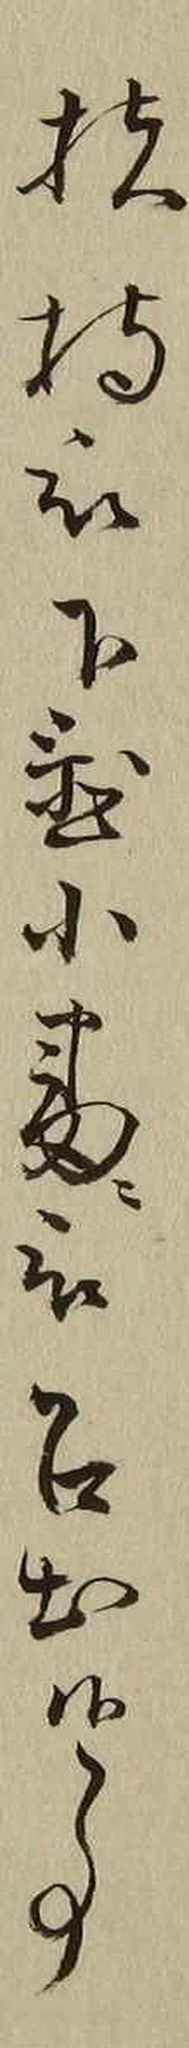扶持被下置小番ニ被召出候事
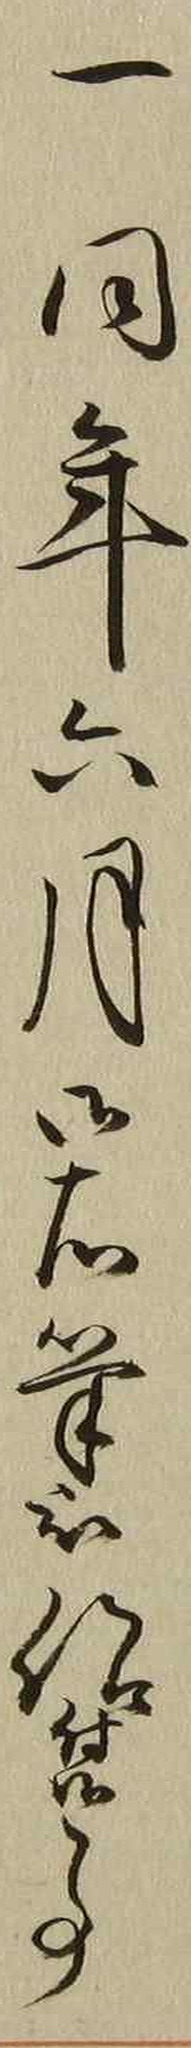一同年六月御右筆被仰付候事
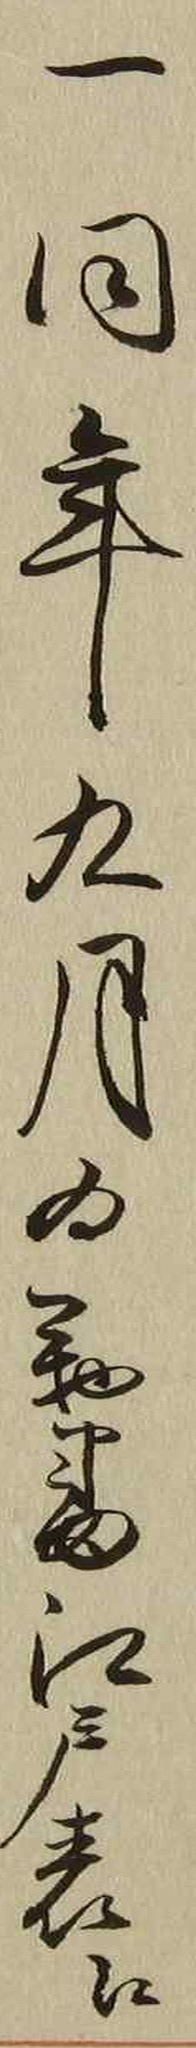一同年九月為勤番江戸表江
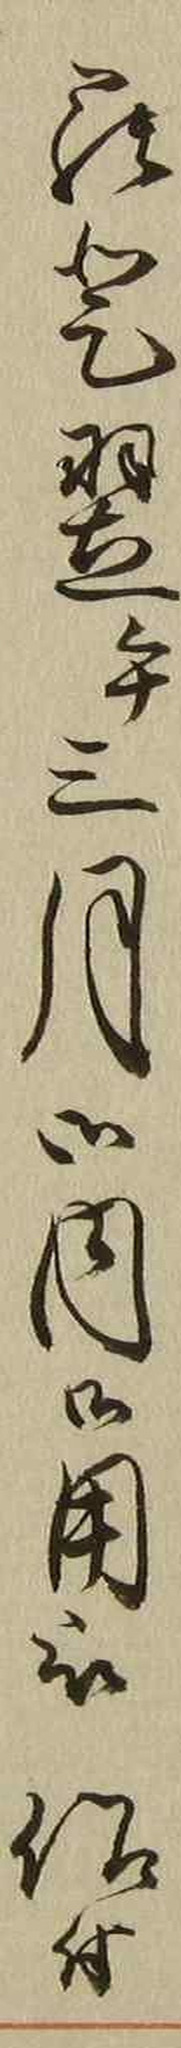罷登翌午三月御内御用被仰付
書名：諸士系譜　巻之57　ほ之部4
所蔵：会津若松市立会津図書館
